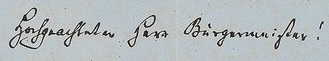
Hochgeachteter Herr Bürgermeister!
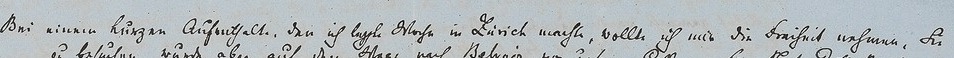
Bei einem kurzen Aufenthalt, den ich lezzte Woche in Zürich machte, wollte ich mir die Freiheit nehmen, Sie
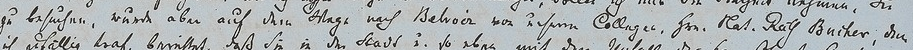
zu besuchen, wurde aber auf dem Wege nach Belvoir von unserm Collegen, Hrn. Nat.Rath Bucher, den
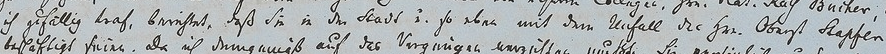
ich zufällig traf, berichtet, daß Sie in der Stadt u. so eben mit dem Unfall des Hrn. Oberst Stapfer
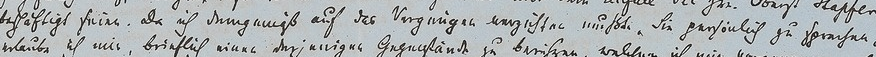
beschäftigt seien. Da ich demgemäß auf das Vergnügen verzichten mußte, Sie persönlich zu sprechen,
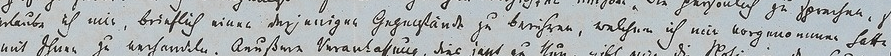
erlaube ich mir, brieflich einen derjenigen Gegenstände zu berühren, welchen ich mir vorgenommen hatte,
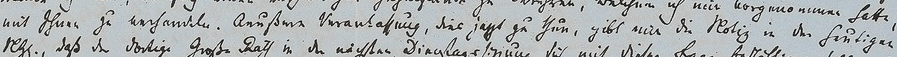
mit Ihnen zu verhandeln. Aeußere Veranlassung, dies jetzt zu thun, gibt mir die Notiz in der heutigen
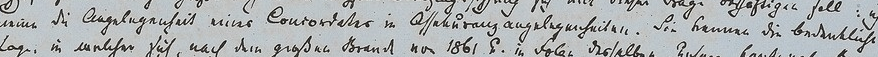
meine die Angelegenheit eines Concordates in Assekuranzangelegenheiten. Sie kennen die bedenkliche
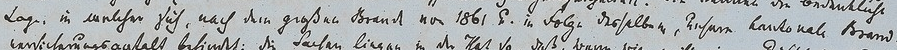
Lage, in welcher sich, nach dem großen Brand von 1861 u. in Folge desselben, unsere kantonale Brand-
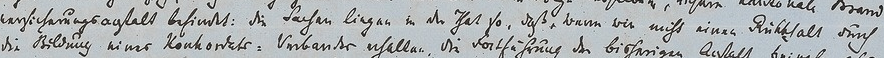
versicherungsanstalt befindet: die Sachen liegen in der That so, daß, wenn wir nicht einen Rükkhalt durch
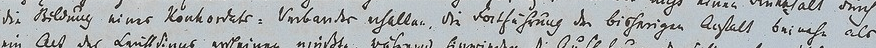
die Bildung eines Konkordats-Verbandes erhalten, die Fortführung der bisherigen Anstalt beinahe als
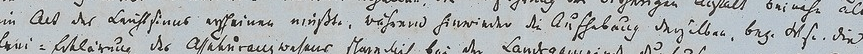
ein Act des Leichtsinns erscheinen müßte, während hinwieder die Aufhebung derselben, bez.Wse. die
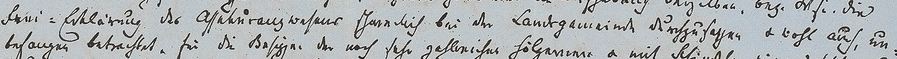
Frei-Erklärung des Assekuranzwesens schwerlich bei der Landsgemeinde durchzusetzen & wohl auch, un-
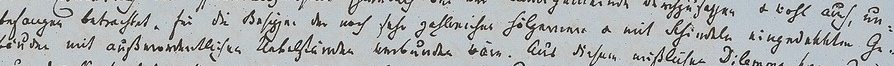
befangen betrachtet, für die Besitzer der noch sehr zahlreichen hölzernen & mit Schindeln eingedekkten Ge-
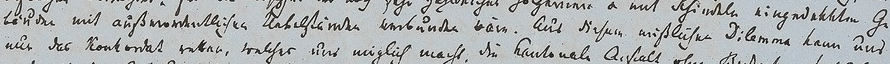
bäude mit außerordentlichen Uebelständen verbunden wäre. Aus diesem mißlichen Dilemma kann uns
